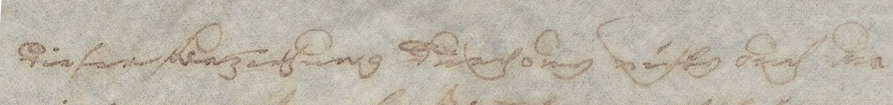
dieser Beziehung durchaus nichts auch nur
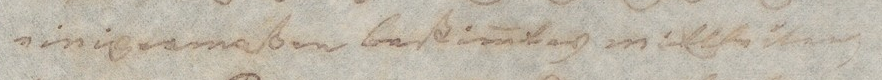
einigermaßen bestimmtes mittheilen,
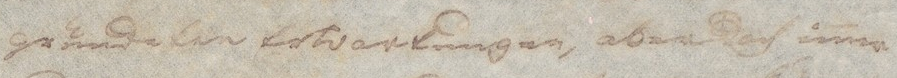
gründeten Erwartungen, aber doch immer
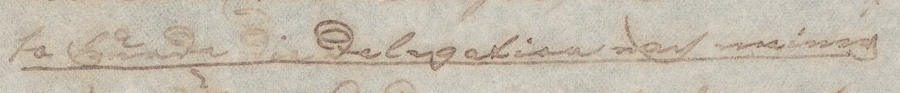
so würde die Delegation nach meiner
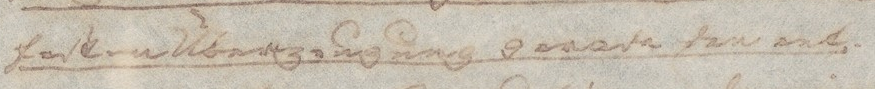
festen Überzeugung gerade den ent-
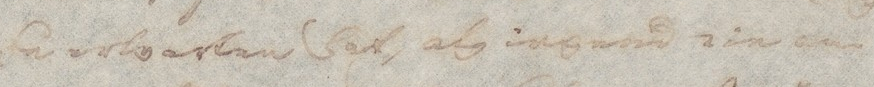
zu erwarten hat, als irgend ein an-
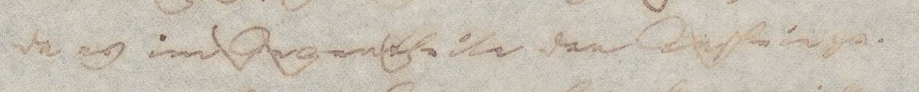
de es im Gegentheile den Anschein ge-
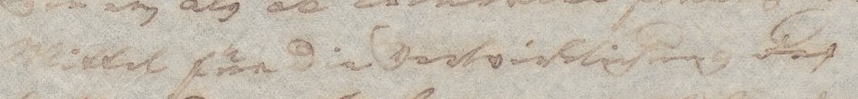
Mittel für die Verwirklichung des
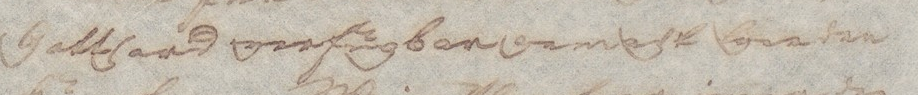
Gotthard verfügbar gemacht werden
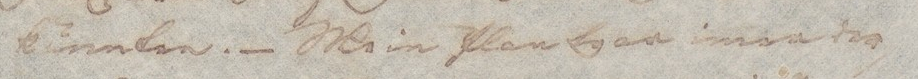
könnten. – Mein Plan war imer der,
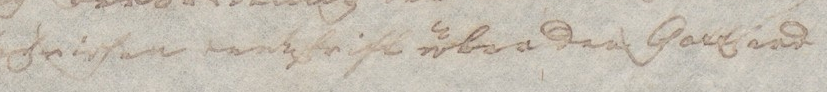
technischen Denkschrift über den Gotthard
